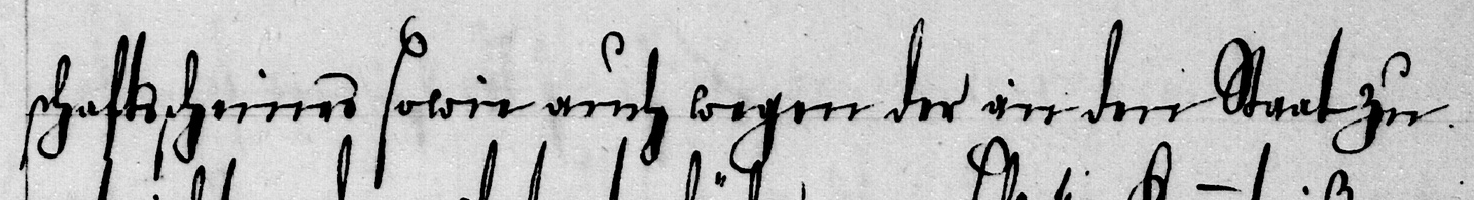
chaftsscheines sowie auch wegen der an den Staat zu
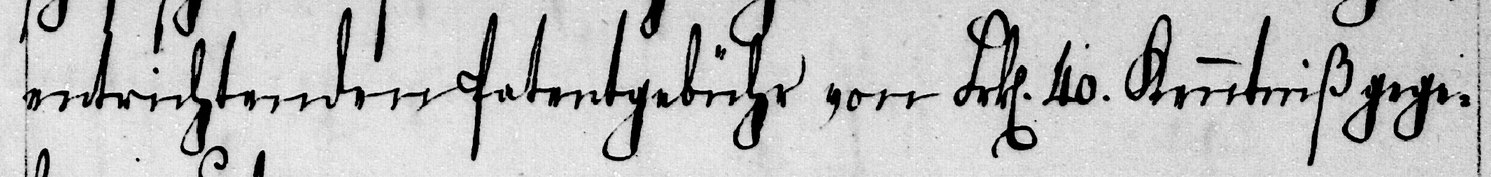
entrichtenden Patentgebühr von Frk[en]. 40. Kenntniß gege¬
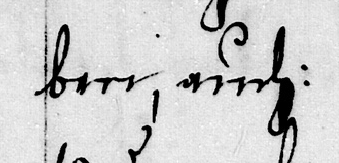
ben, auch:
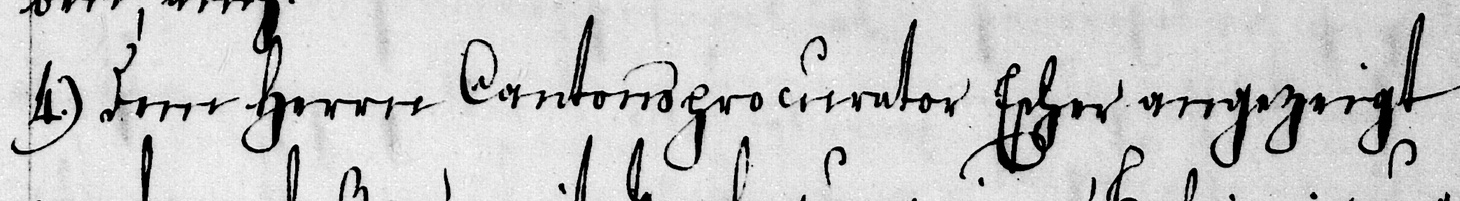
4.) Dem Herrn Cantonsprocurator Escher angezeigt
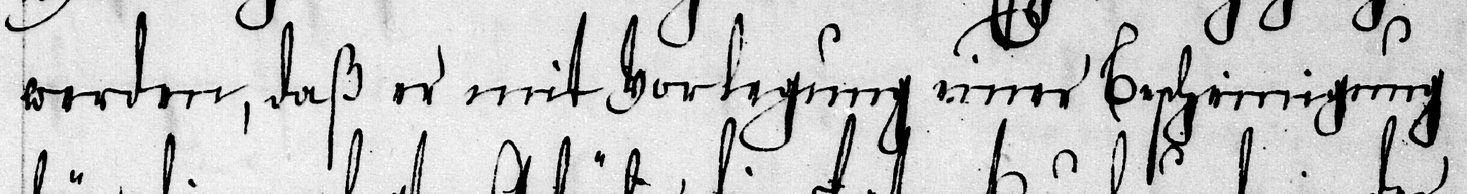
werden, daß er mit Vorlegung einer Bescheinigung
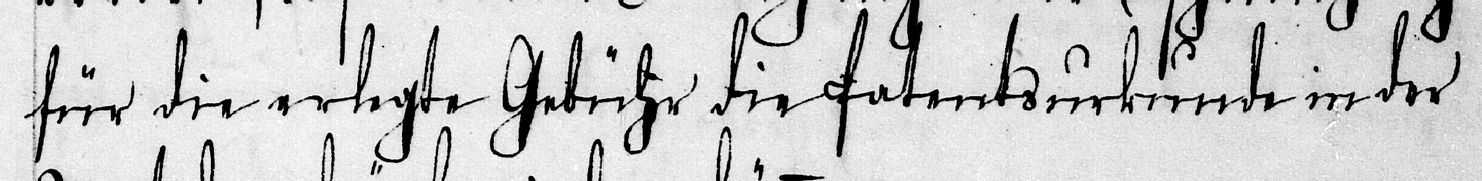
für die erlegte Gebühr die Patentsurkunde in der
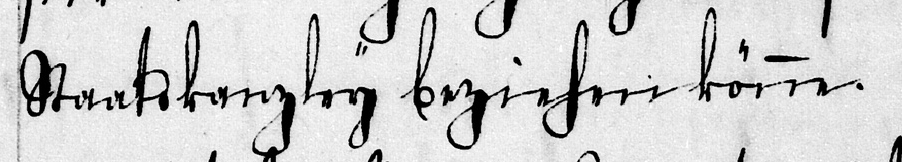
Staatskanzley beziehen könne.
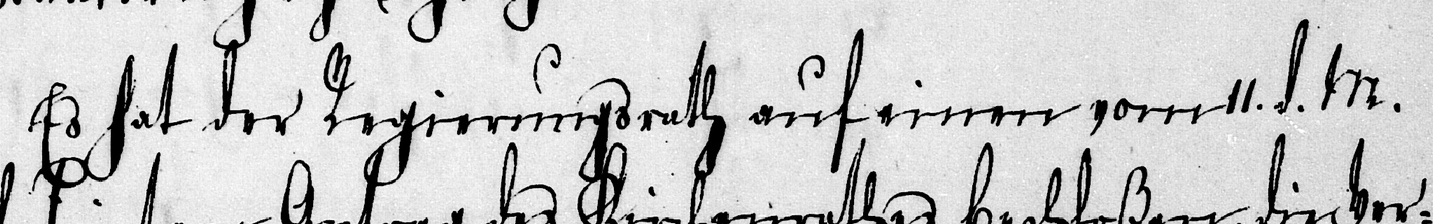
Es hat der Regierungsrath auf einen vom 11. d. M.
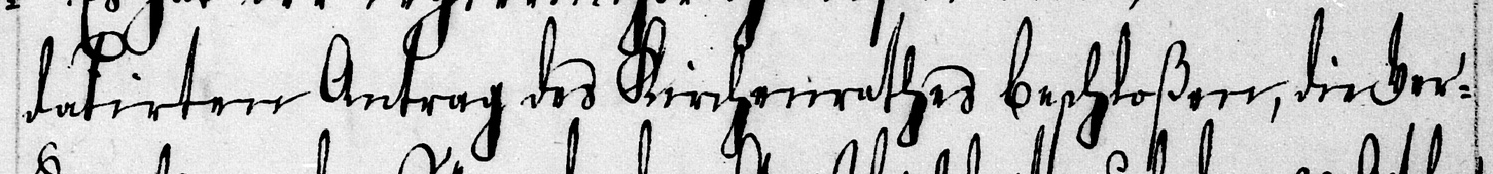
datirten Antrag des Kirchenrathes beschloßen, die Ver¬
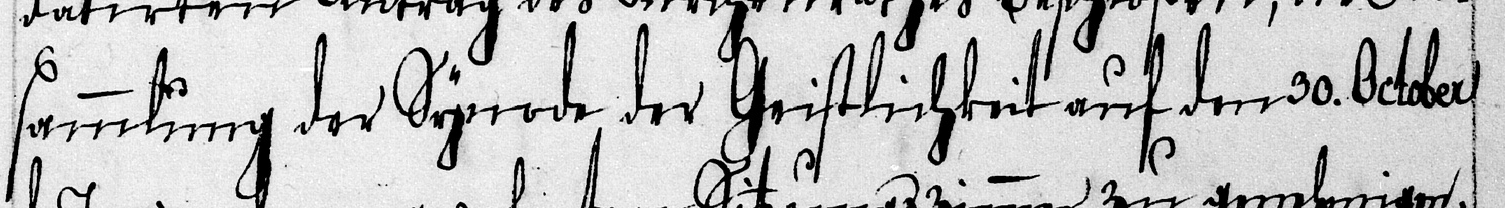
sammlung der Synode der Geistlichkeit auf den 30. October
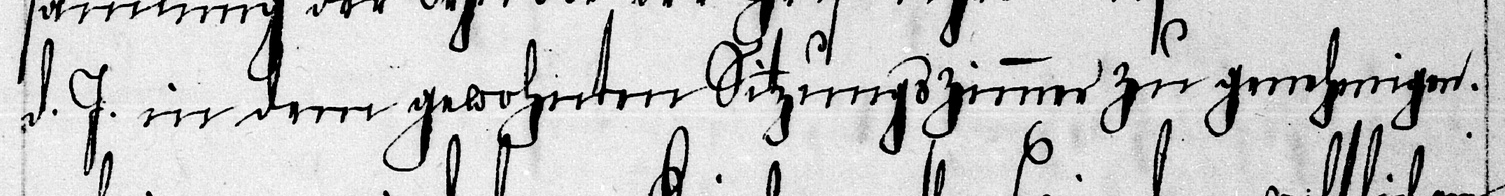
d. J. in dem gewohnten Sitzungszimmer zu genehmigen.
